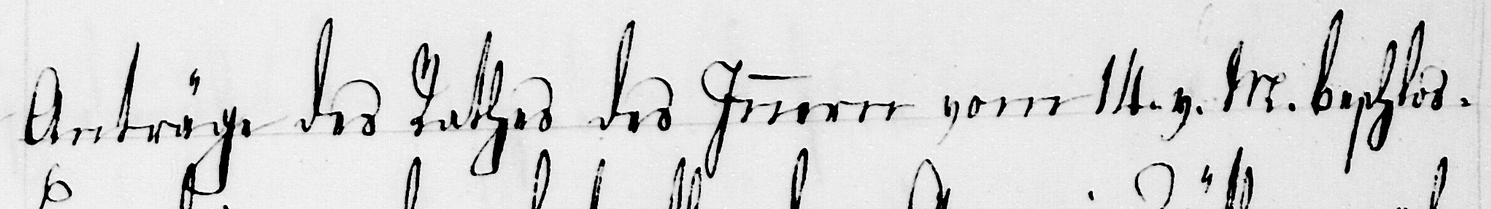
Anträge des Rathes des Innern vom 14. v. M. beschlo¬
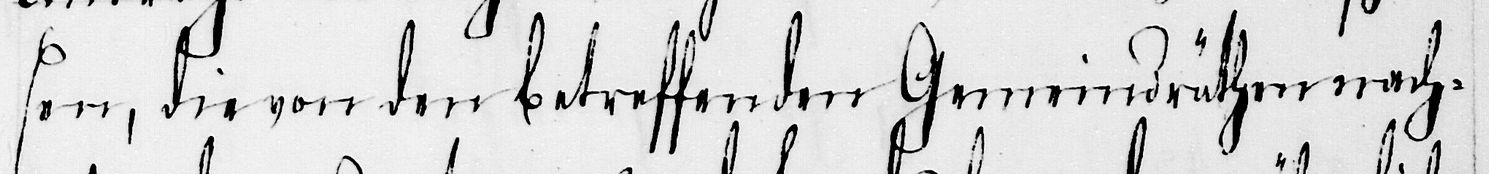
ßen, die von den betreffenden Gemeindräthen nach¬
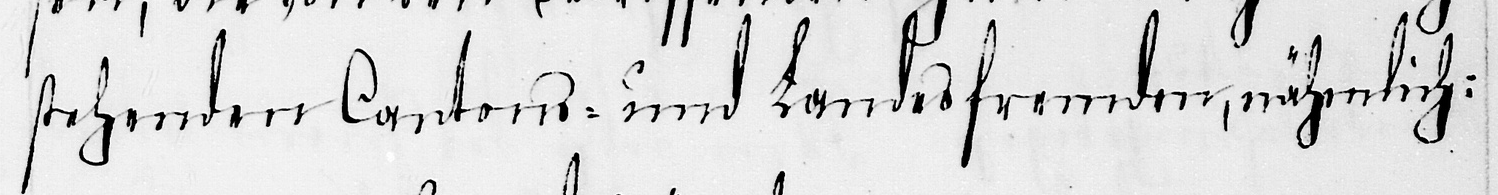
stehenden Cantons- und Landesfremden, nähmlich:
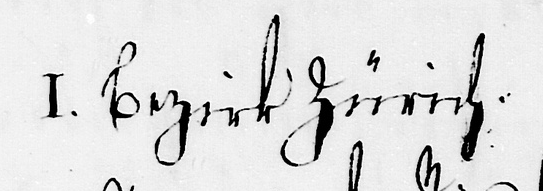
I. Bezirk Zürich.
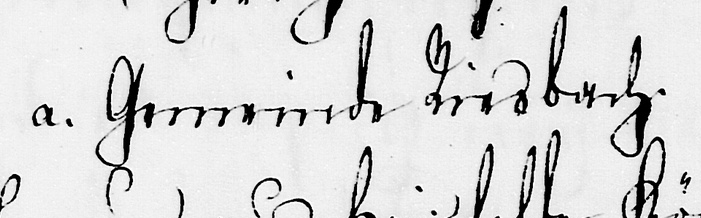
a. Gemeinde Riesbach.
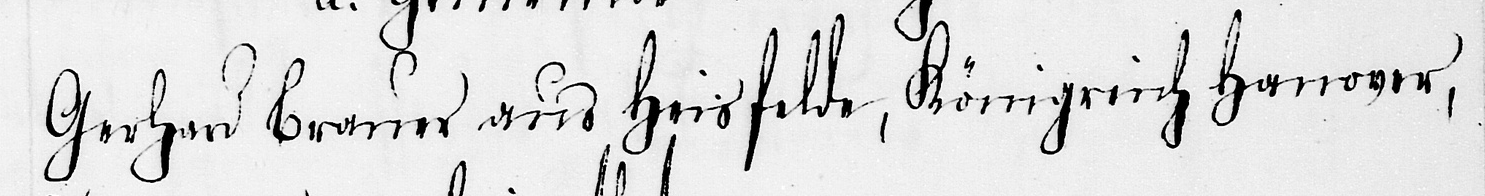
Gerhard Brauer aus Heisfelde, Königreich Hanover,
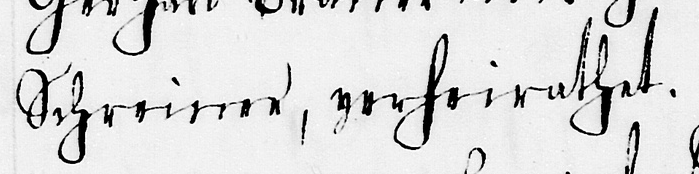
Schreiner, verheirathet.
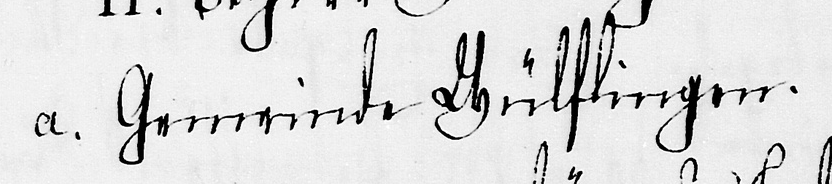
a. Gemeinde Wülflingen.
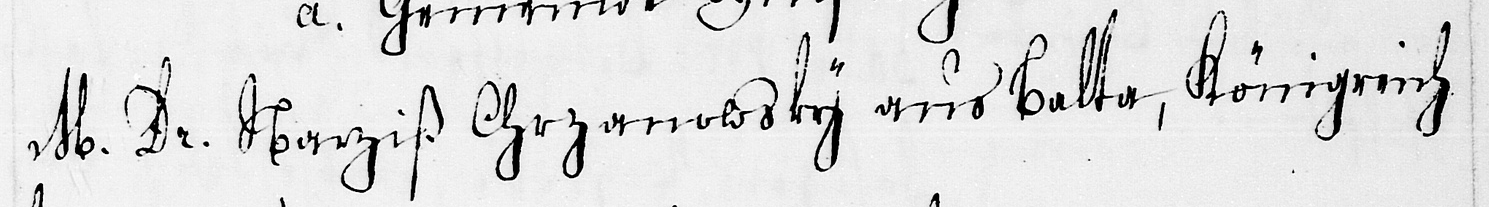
M. Dr. Narziß Chrzanowsky aus Balta, Königreich
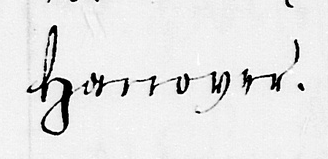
Hanover.
